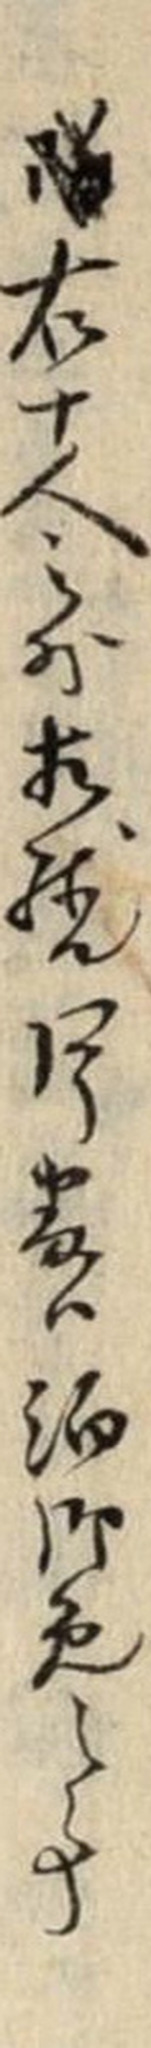附右十人之外相残る御番は泊御免之事
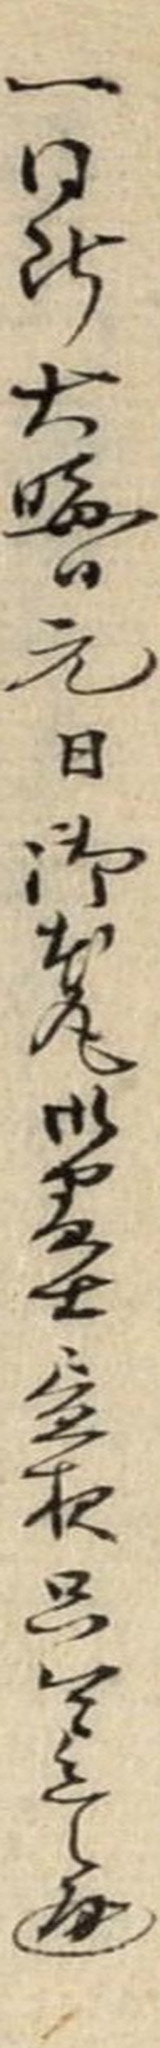一同断大晦日元旦御本丸御番士昼夜只今迄之通
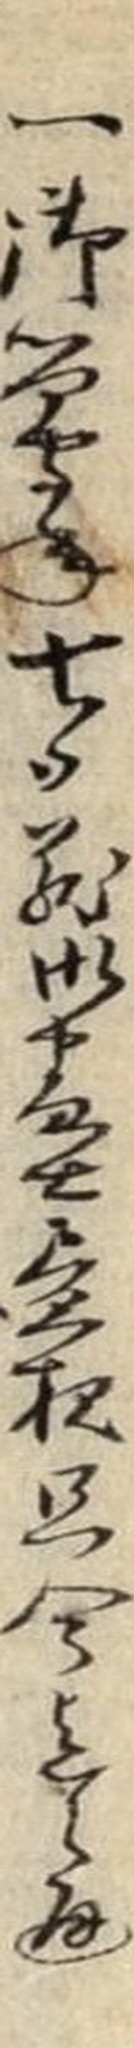一御留守年七ッ蔵御番士昼夜只今迄之通
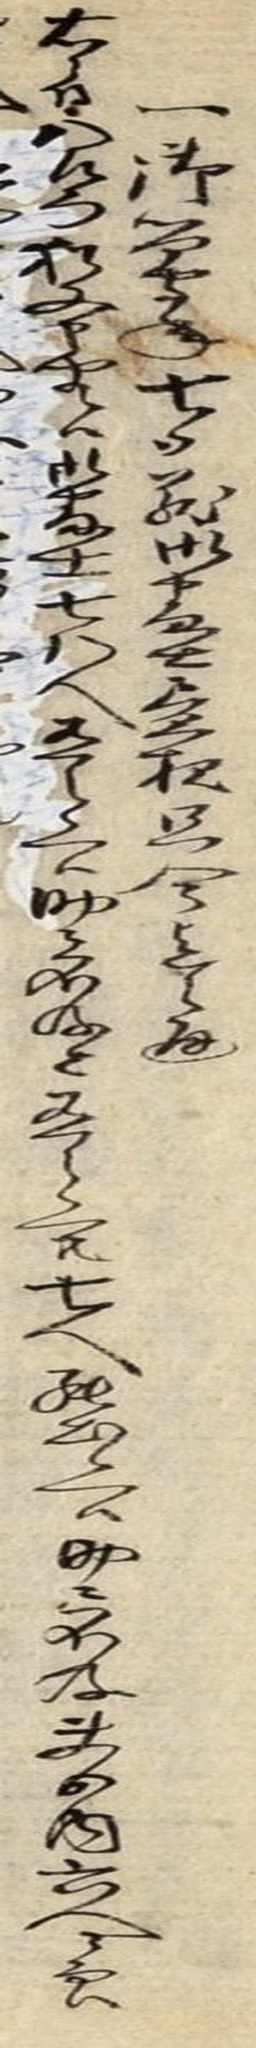右に付八左衛門猶又申聞候は御番士七八人有之候へは助に不及と有之候へ共七人罷出候へは助に不及夫ゟ内六人に而は
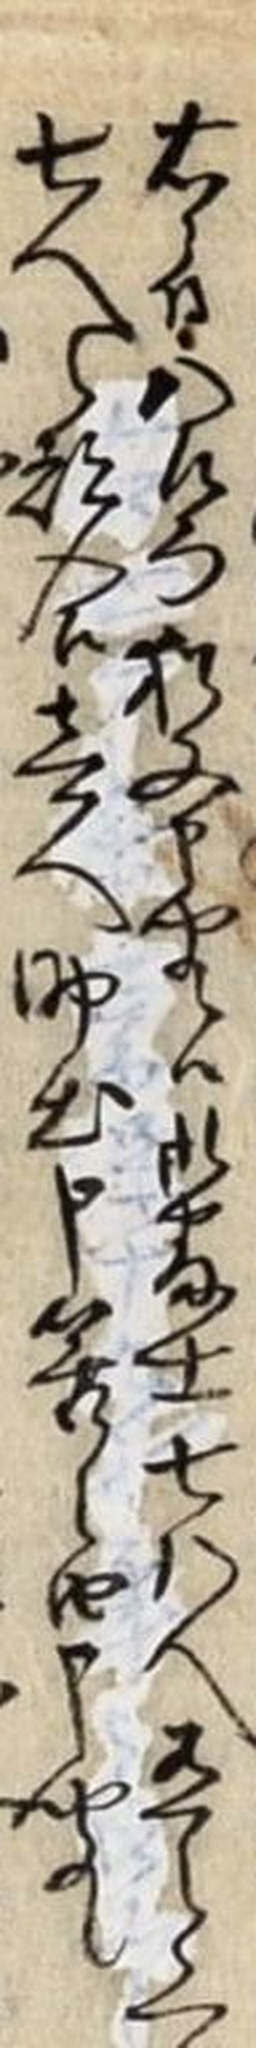七人へ都合壱人助出申筈之由申聞候
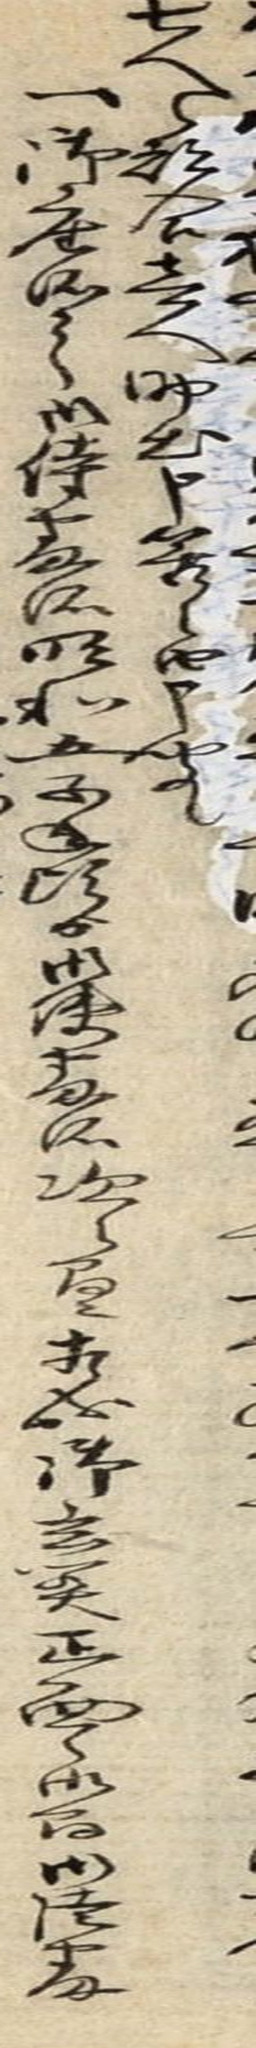一御座所之御侍番所明和五子年頃ゟ御使番所次之間に相成御玄関正面之御間御徒番
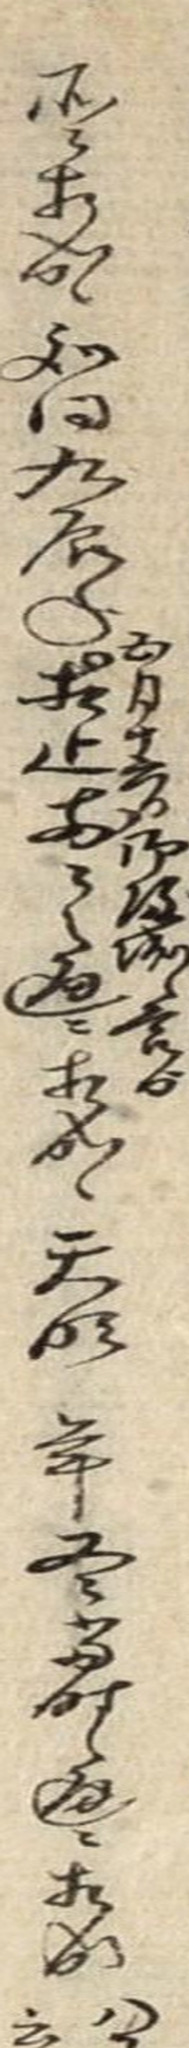所に相成候処同九辰年五月十六日御帰城之節ゟ相止前々之通に相成候天明年又々当時之通に相成
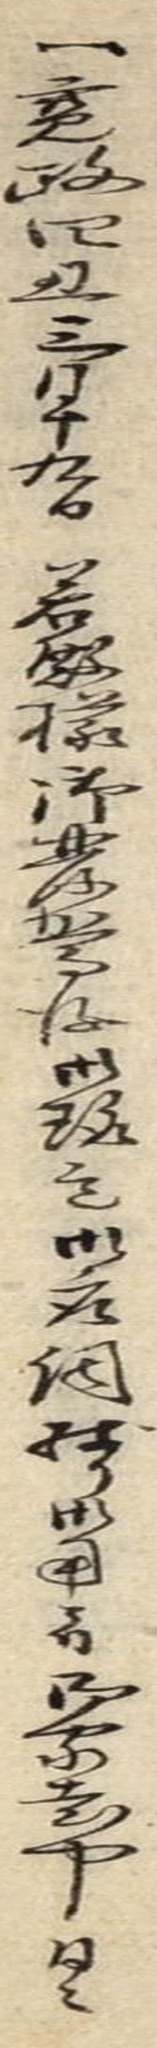一寛政四丑三月十九日若殿様御発駕後御趣意御取調残り御用に付御家老中日々
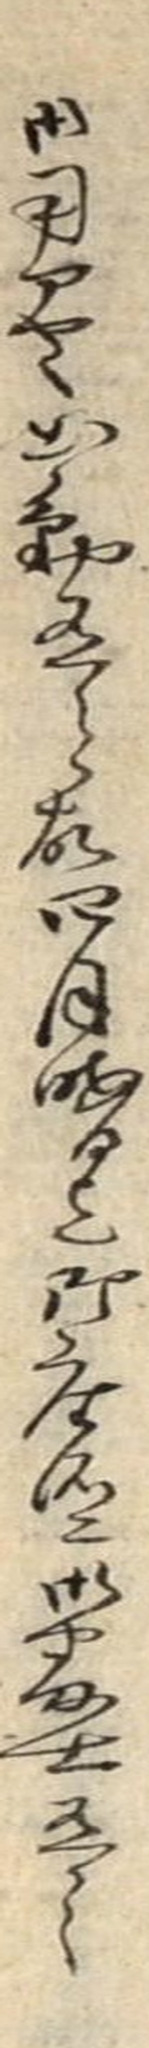御用部やへ出勤有之候故四月晦日迄御座所に御番士有之

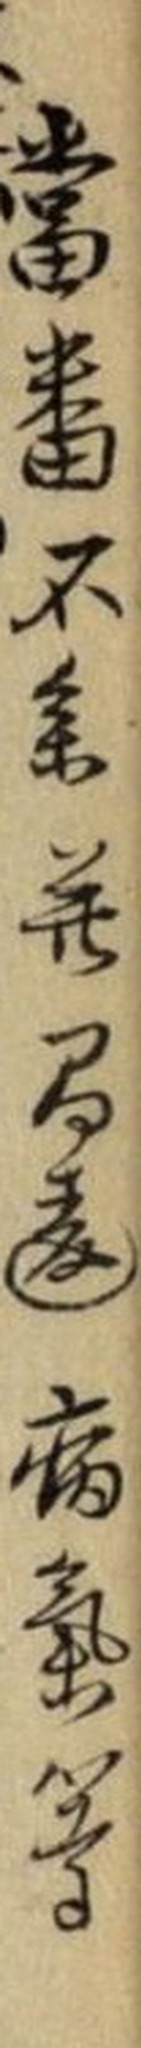当番不参并間違病気等
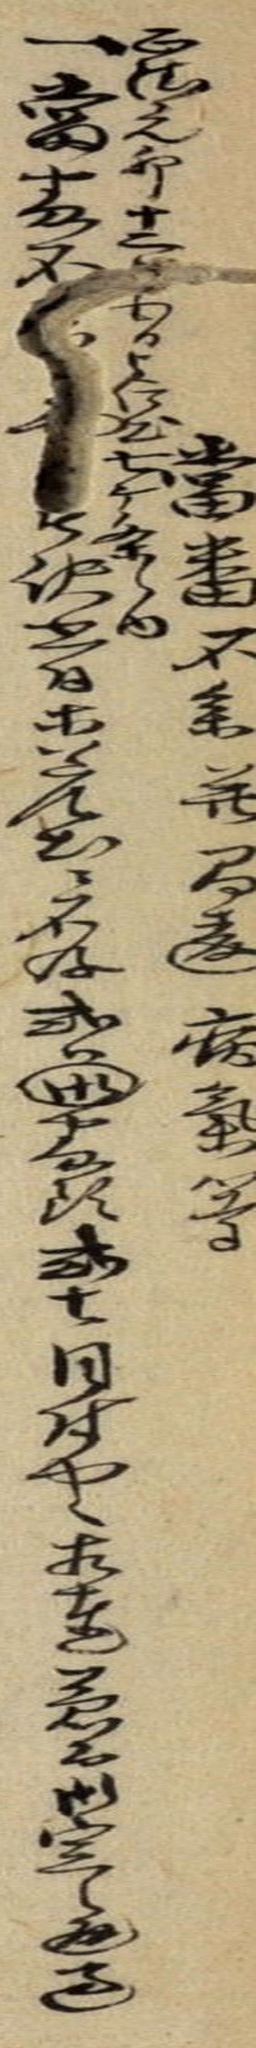一当番不参之節其訳書付等差出に不及或は御番頭或は目付中へ相達兼而御定之通過
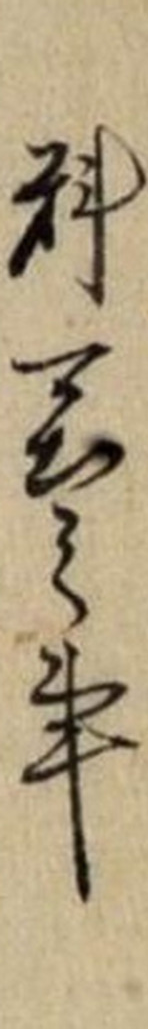料可出候事
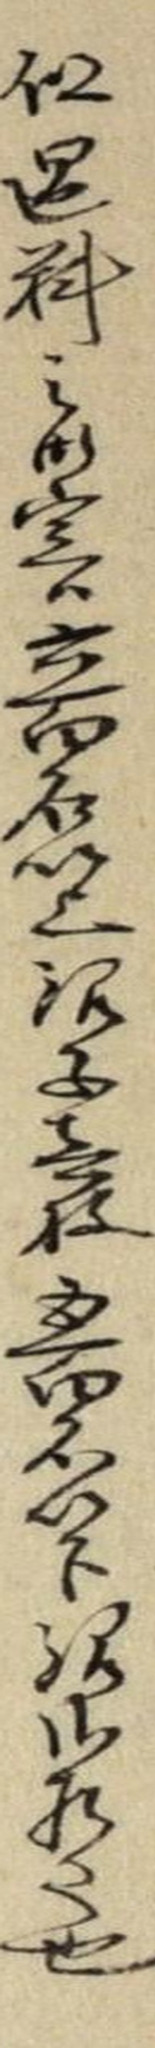但過料之御定は六百石以上銀子壱枚五百石以可銀弐拾匁也
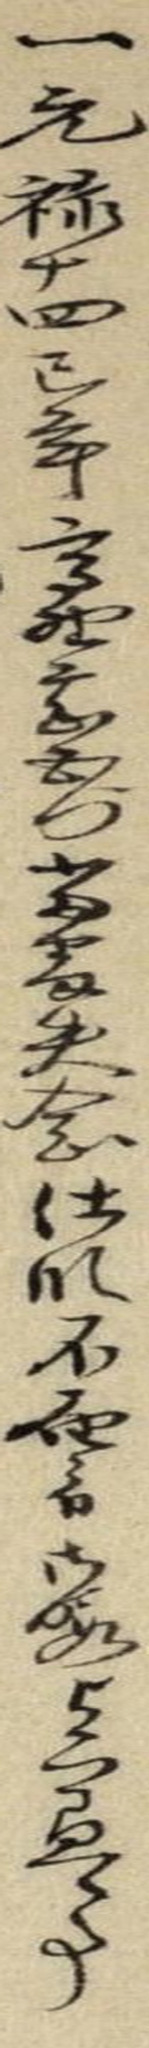一元禄十四巳年高野甚五右衛門当番失念仕候段不届に付御暇被下置候事
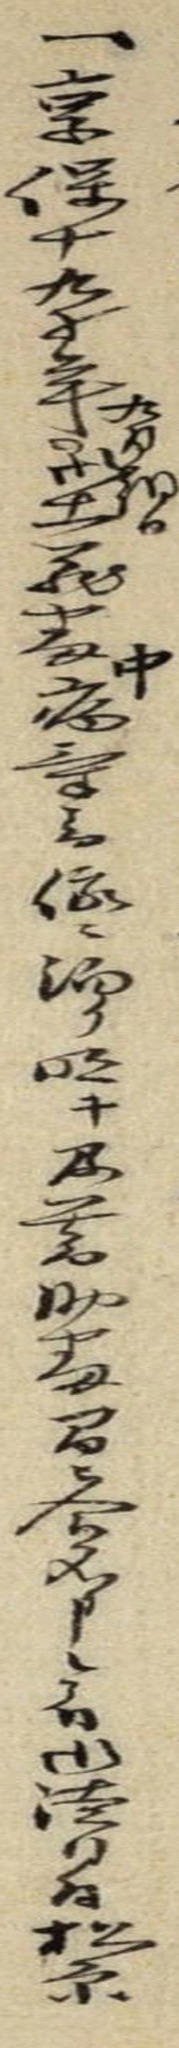一享保十九寅年九月朔日御土蔵番中病気に而俄に泊り明き及暮助番間に合不申候に付御徒目付松原
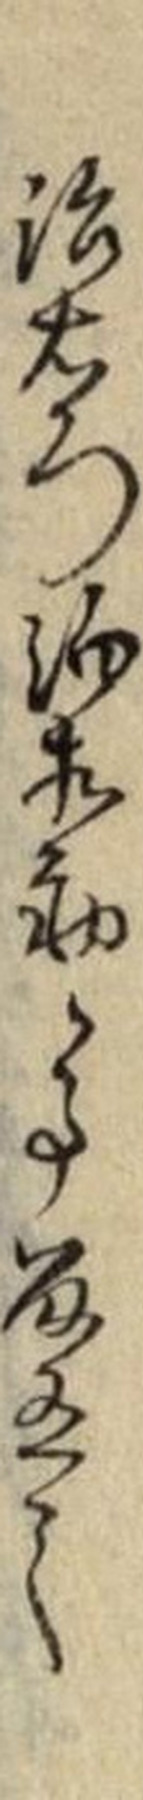治右衛門泊相勤候事留有之
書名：蒐輯之部
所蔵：福井県文書館 Fukui Prefectural Archives
